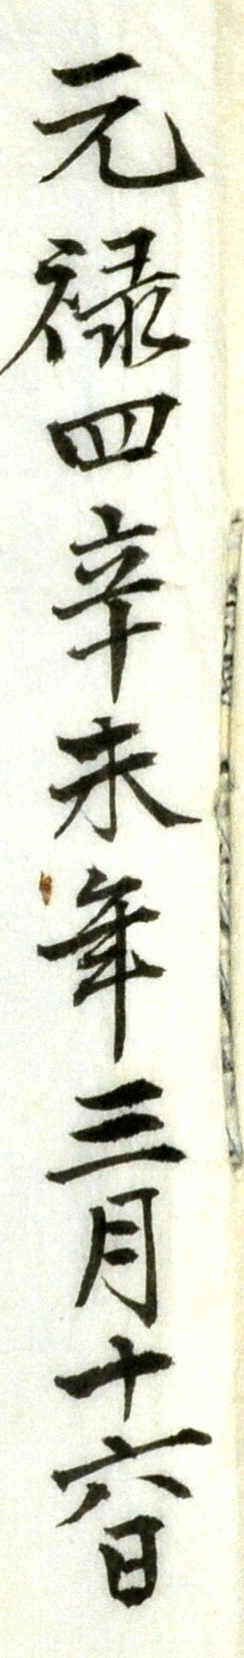元禄四辛未年三月十六日
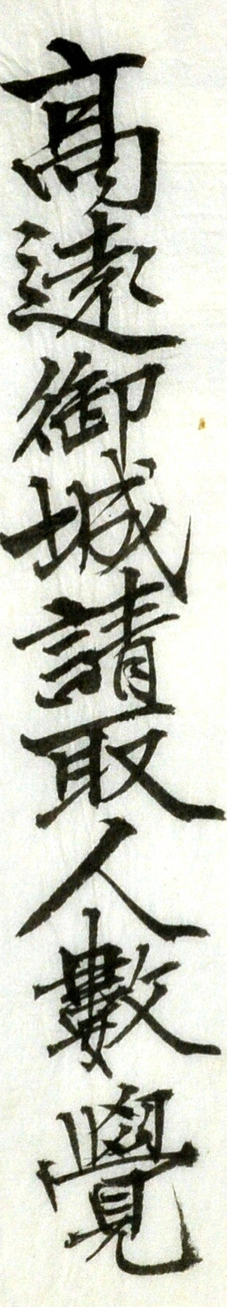高遠御城請取人数覚

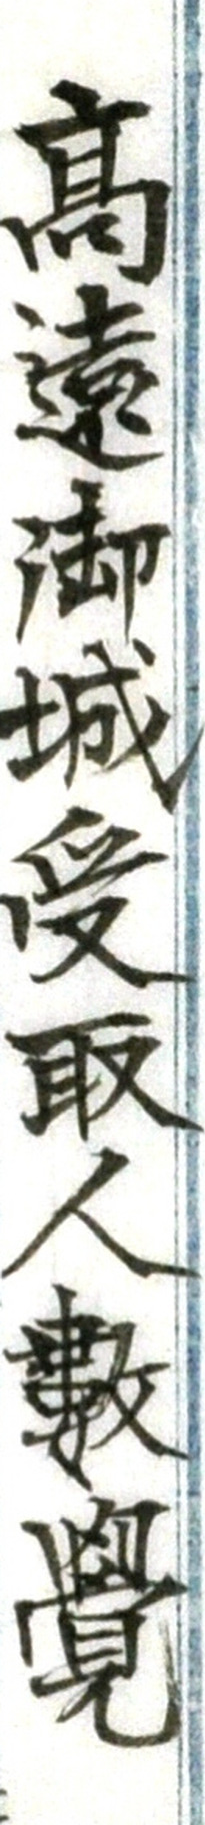高遠御城受取人数覚
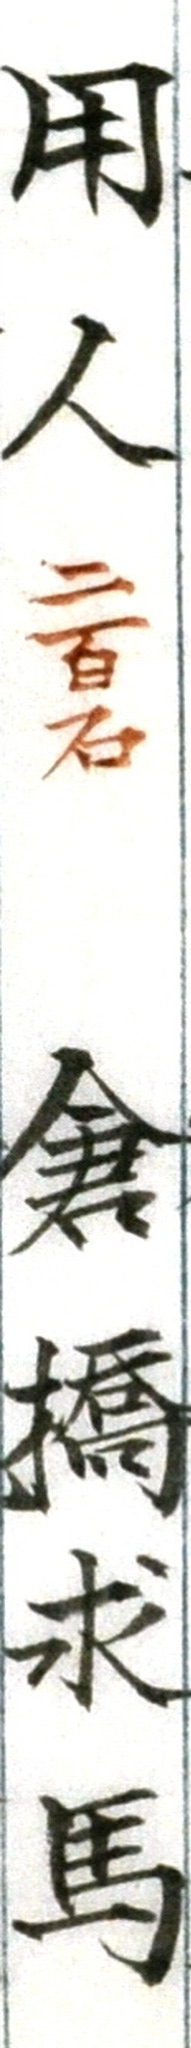用人二百石倉橋求馬
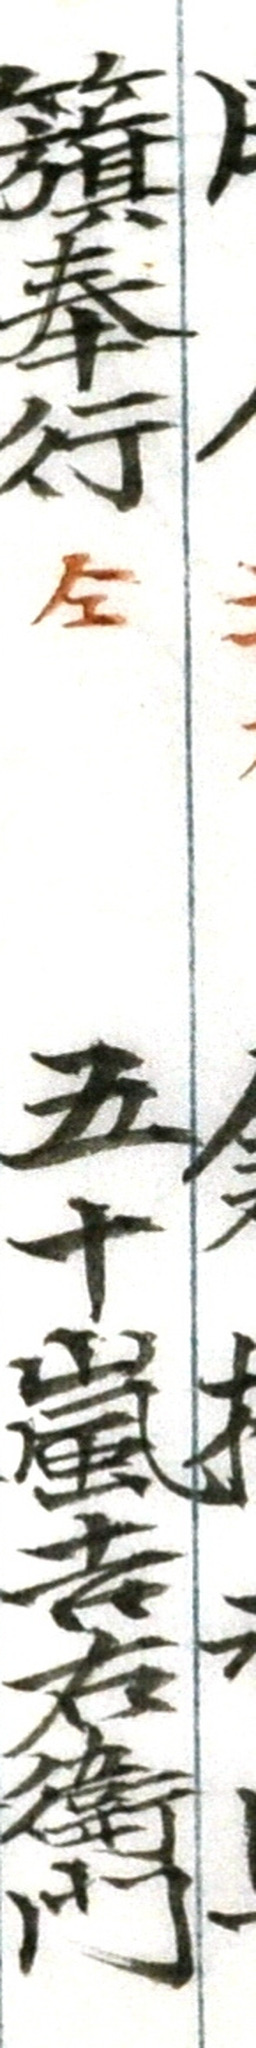籏奉行同五十嵐吉右衛門
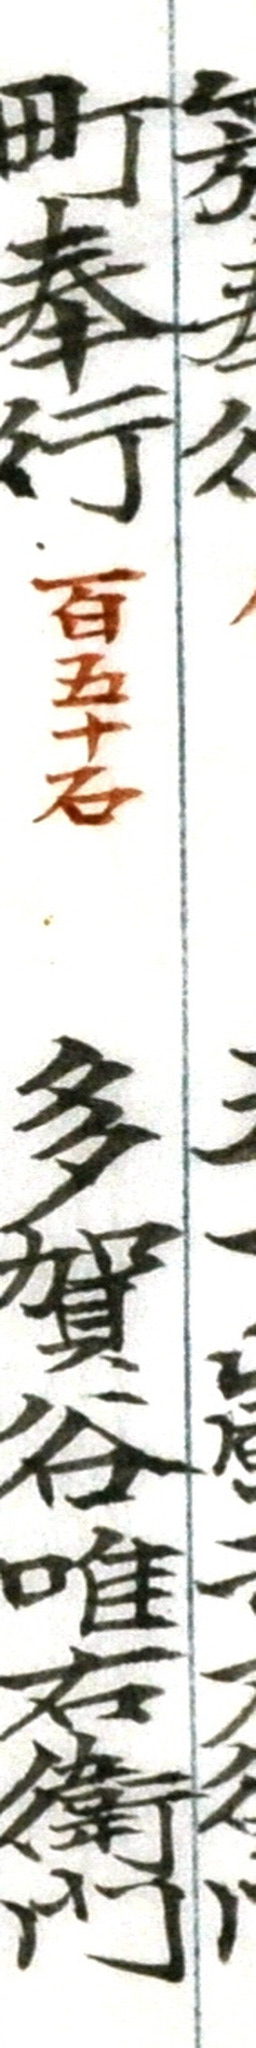町奉行百五十石多賀谷唯右衛門
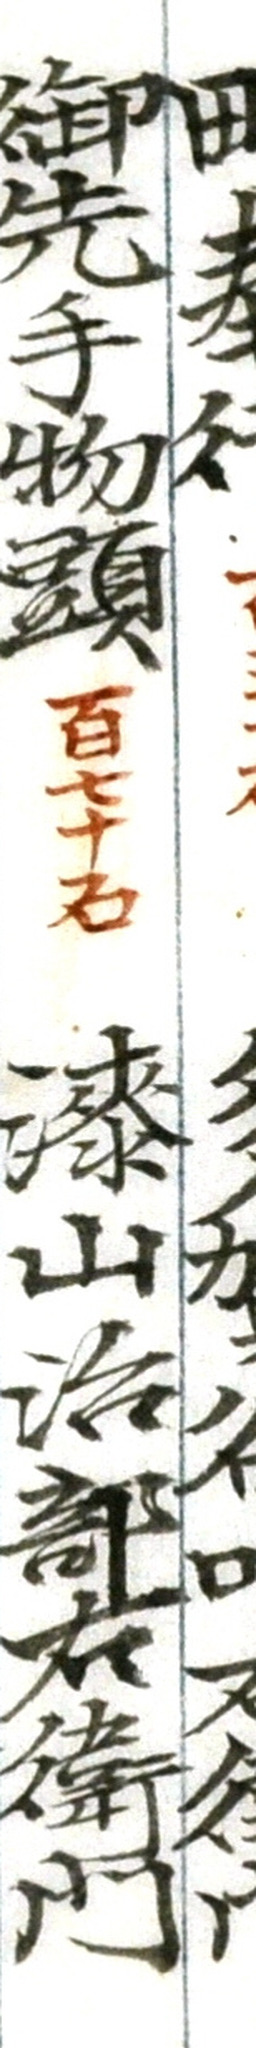御先手物頭百七十石漆山治部右衛門
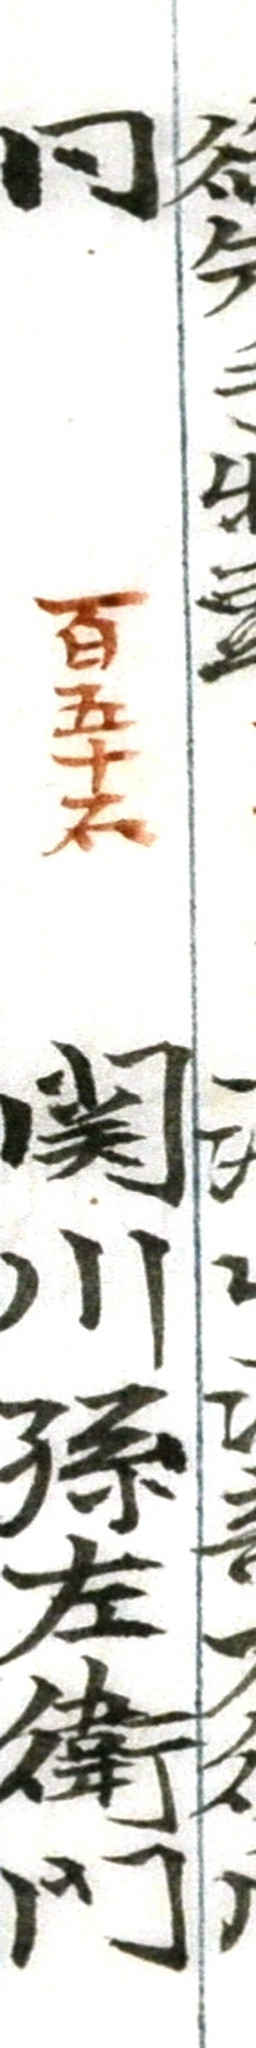同百五十石関山孫左衛門

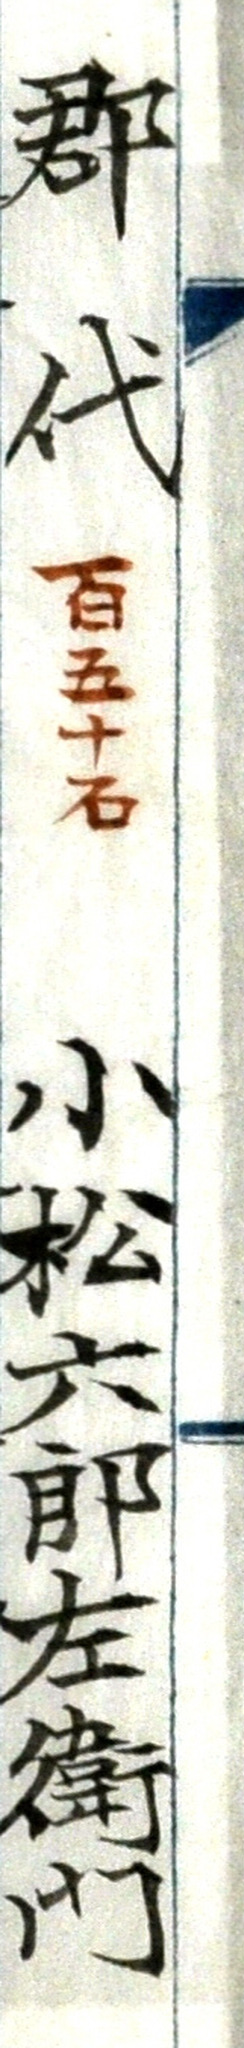郡代百五十石小松六郎左衛門
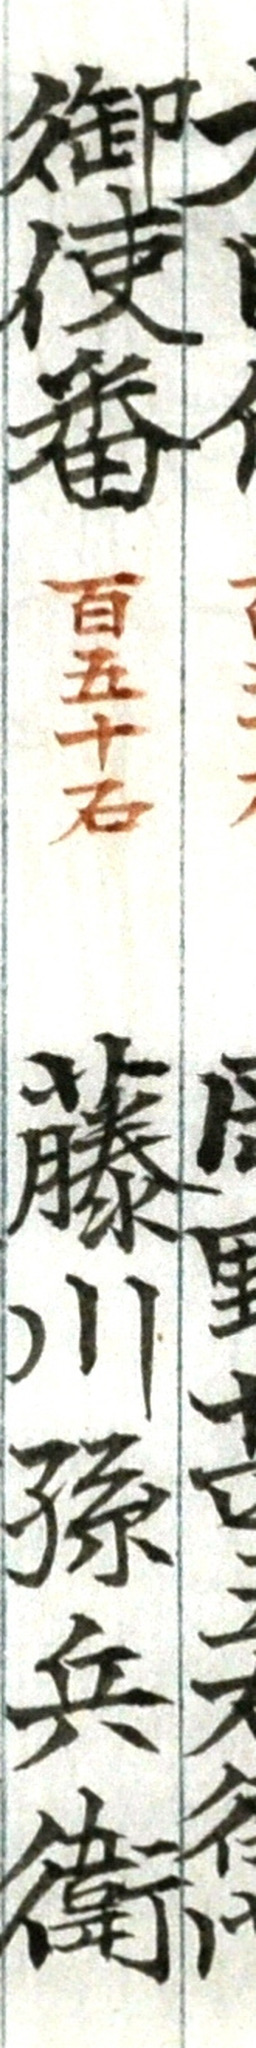御使番百五十石藤川孫兵衛
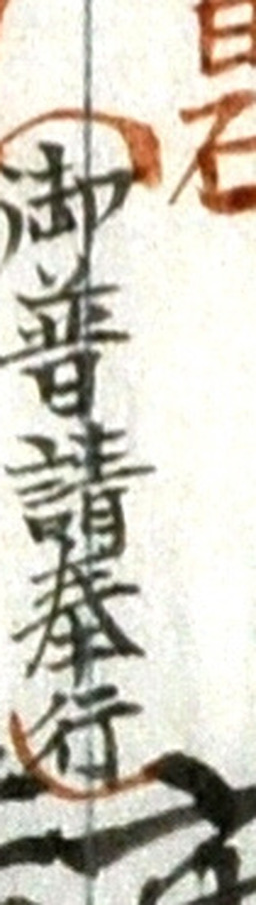御普請奉行
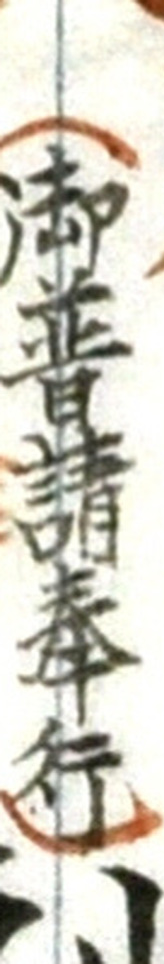御普請奉行
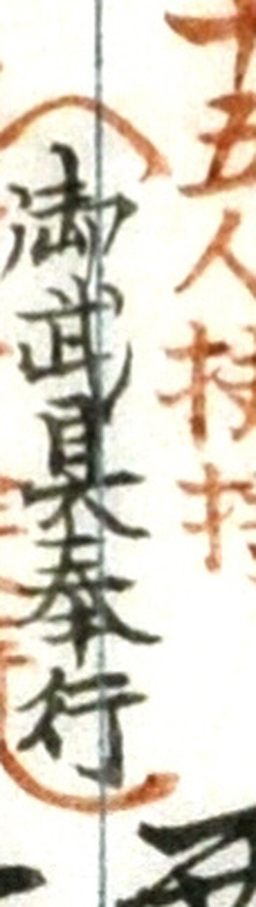御武具奉行
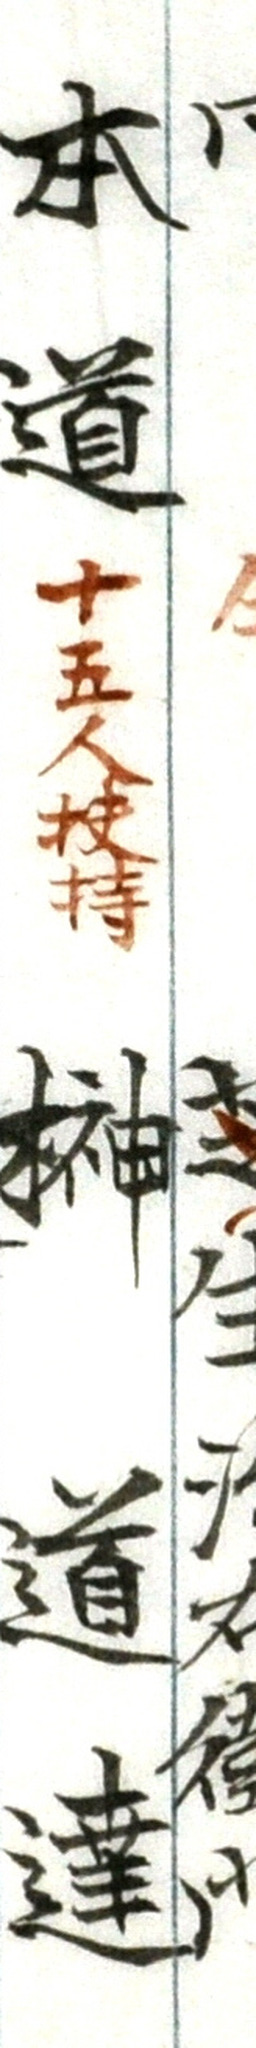本道十五人扶持榊道達

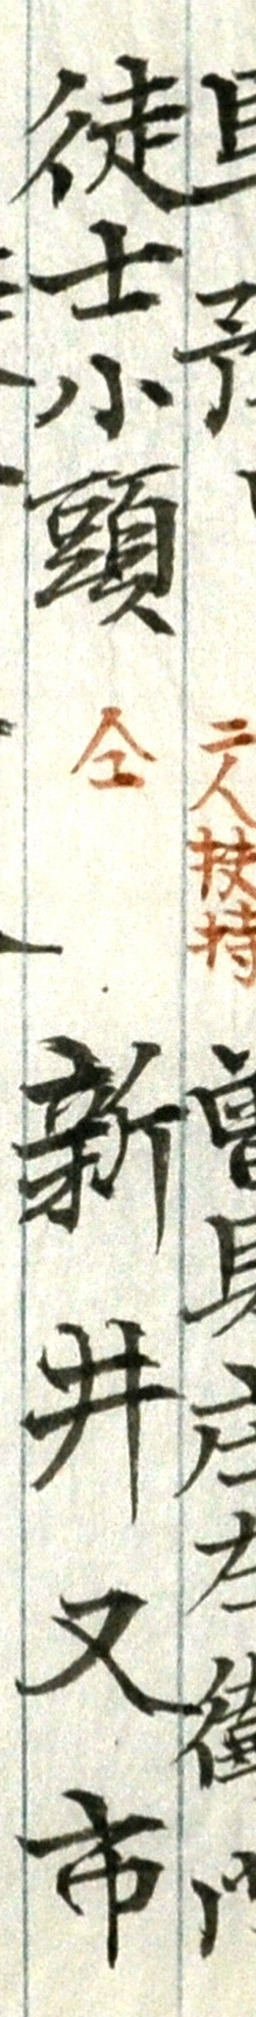徒士小頭同新井又市
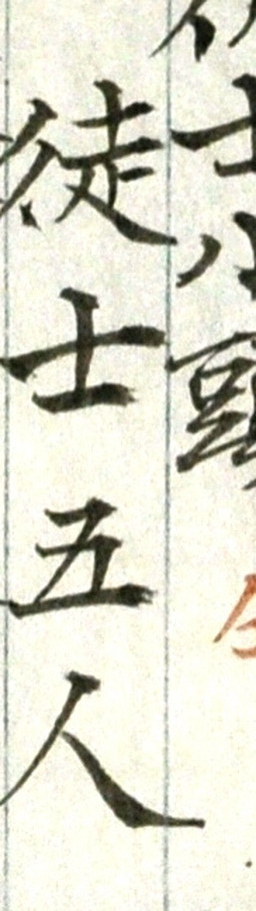徒士五人
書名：高遠城御請取人数覚
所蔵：伊那市立高遠町図書館・合同会社AMANE
